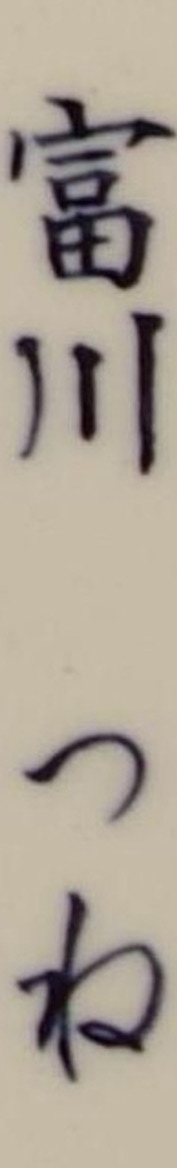富川つね
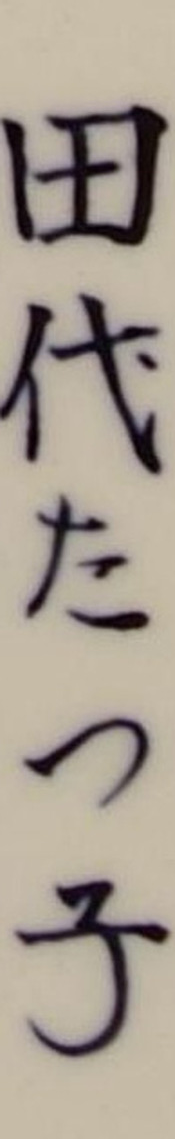田代たつ子
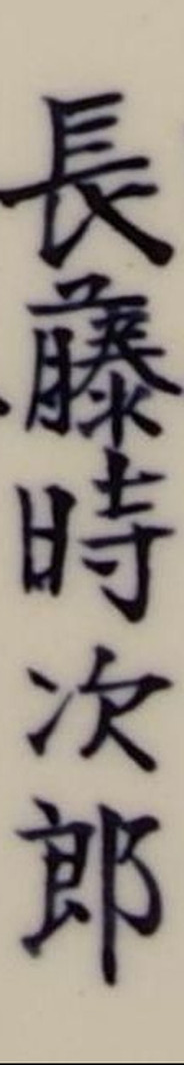長藤時次郎
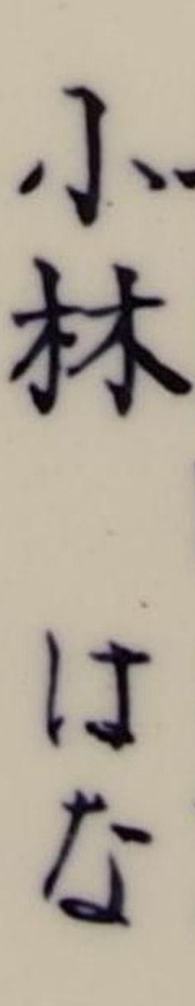小林はな
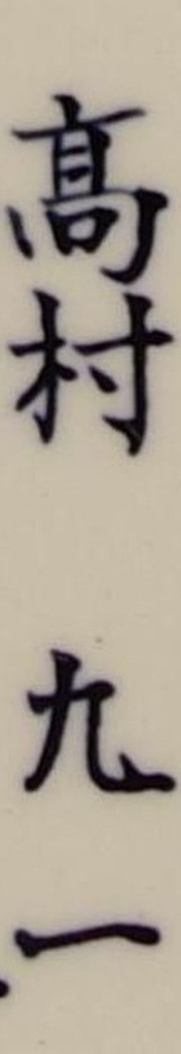高村九一
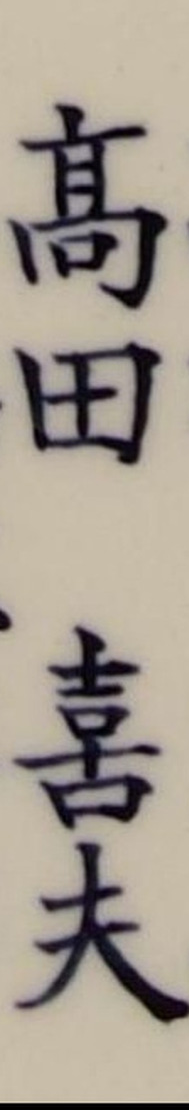高田喜夫
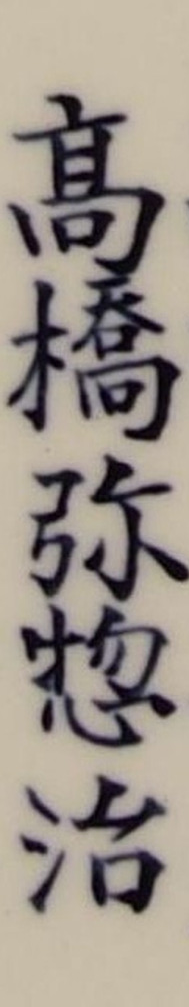高橋弥惣治
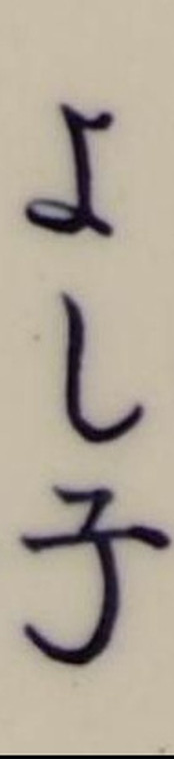よし子
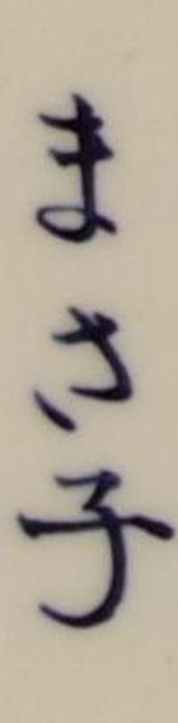まさ子
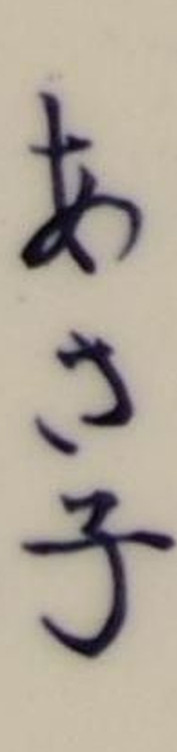あさ子
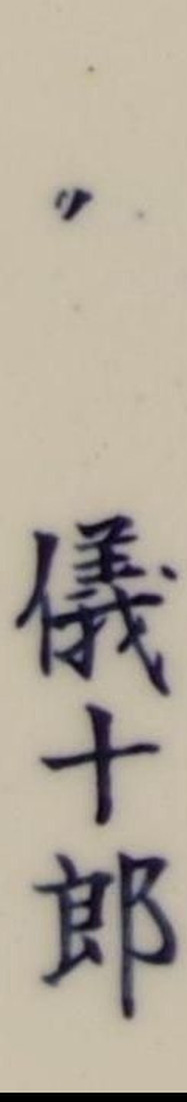儀十郎
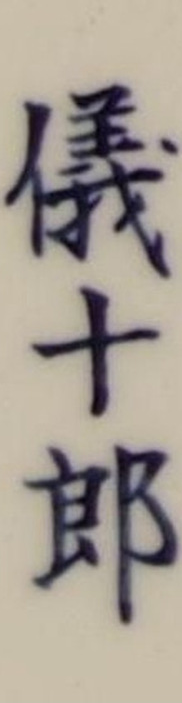儀十郎

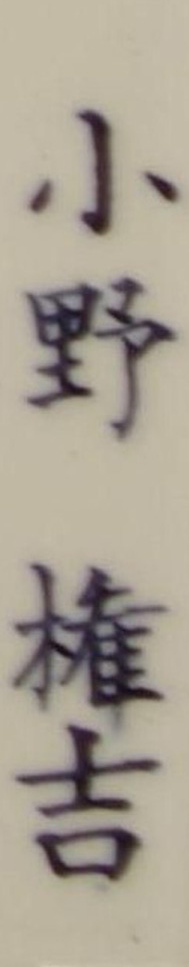小野権吉
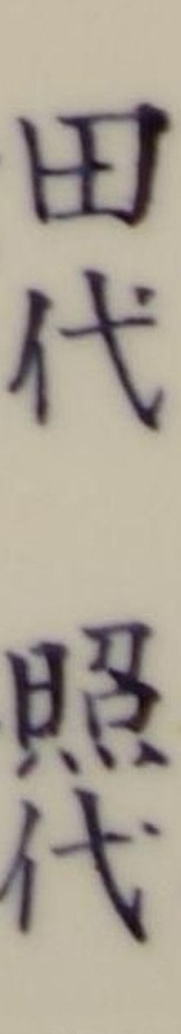田代照代
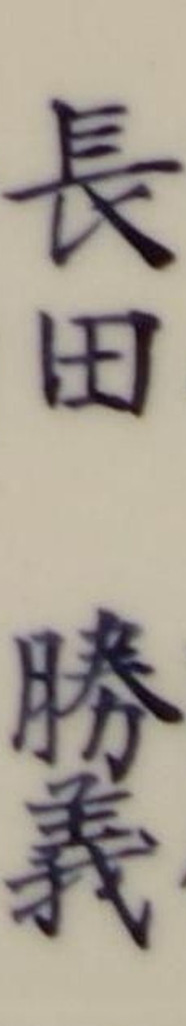長田勝義
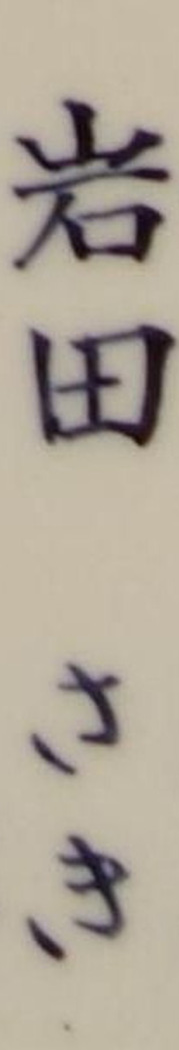岩田さき
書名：E~L
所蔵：高野山金剛峯寺
